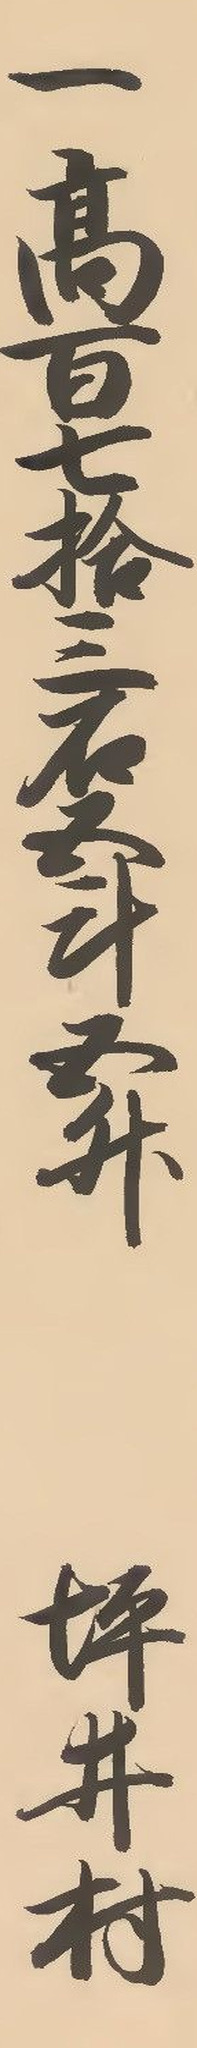一高百七拾三石五斗五升坪井村
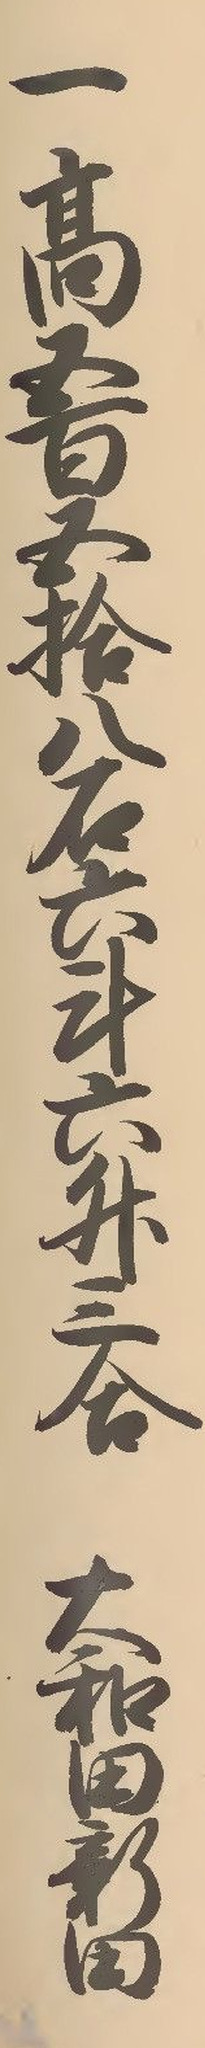一高五百五拾八石六斗六升三合大和田新田
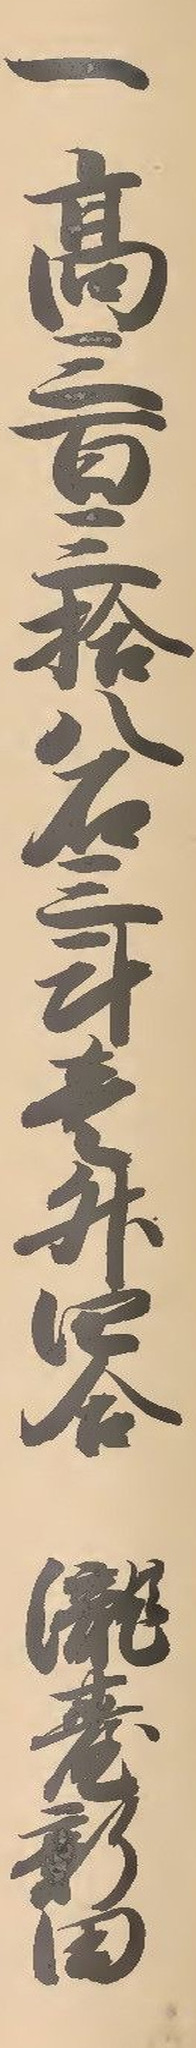一高三百三拾八石三斗壱升四合滝台新田
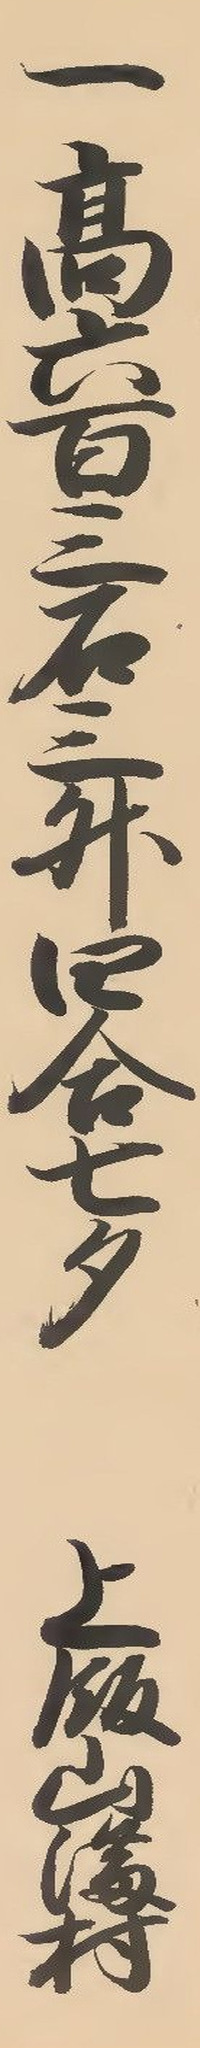一高六百三石三升四合七勺上飯山満村
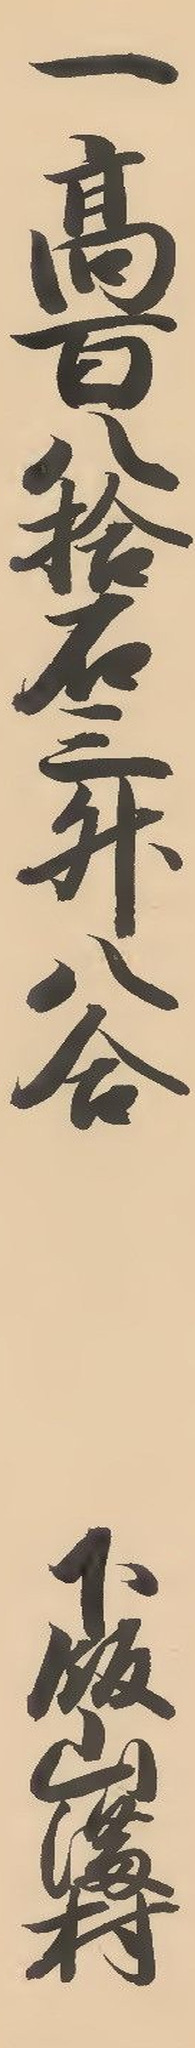一高百八拾石三升八合下飯山満村
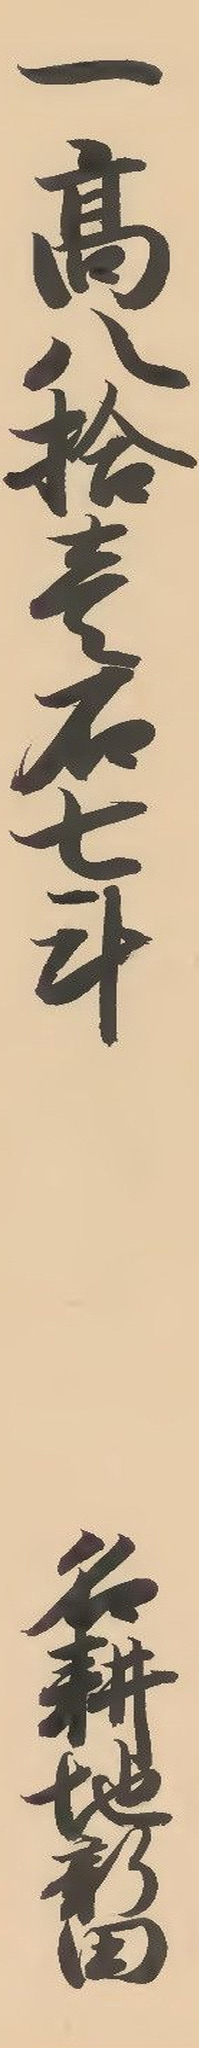一高八拾壱石七斗名耕地新田

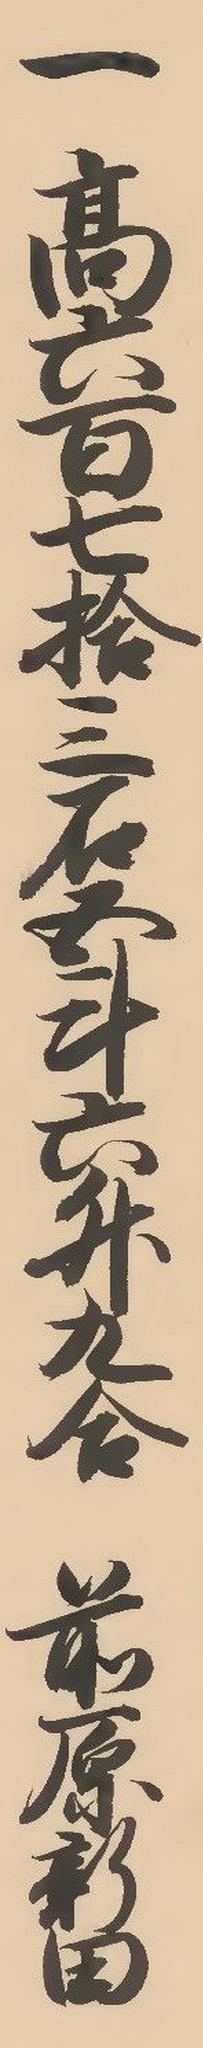一高六百七拾三石五斗六升九合前原新田
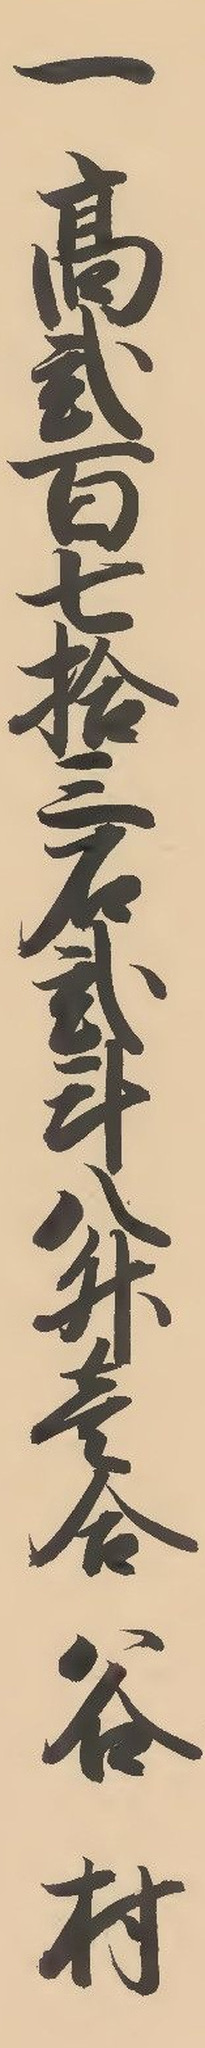一高弐百七拾三石弐斗八升壱合谷村
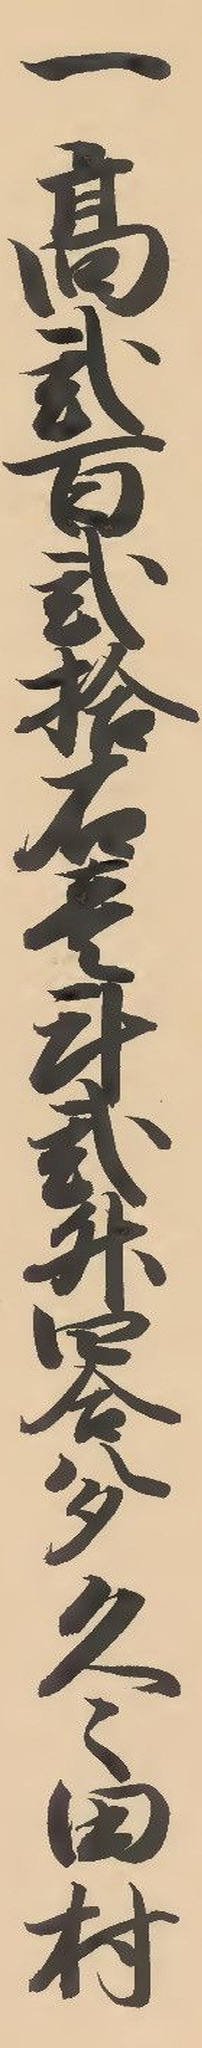一高弐百弐拾石壱斗弐升四合八勺久々田村
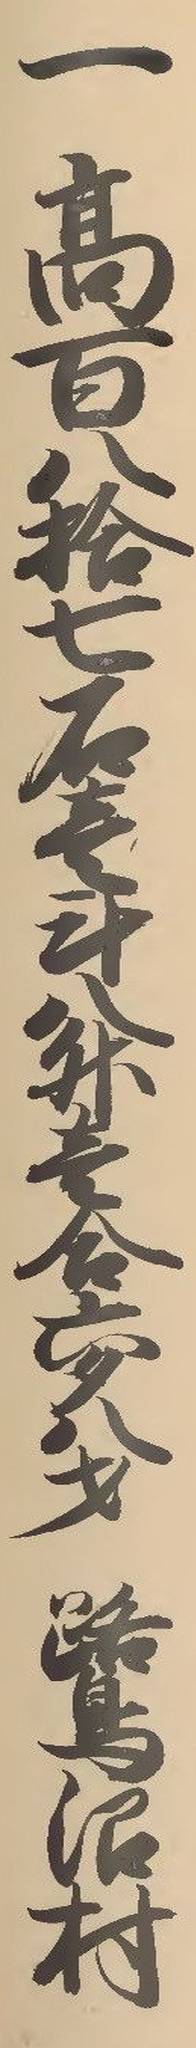一高百八拾七石壱斗八升壱合六勺八才鷺沼村
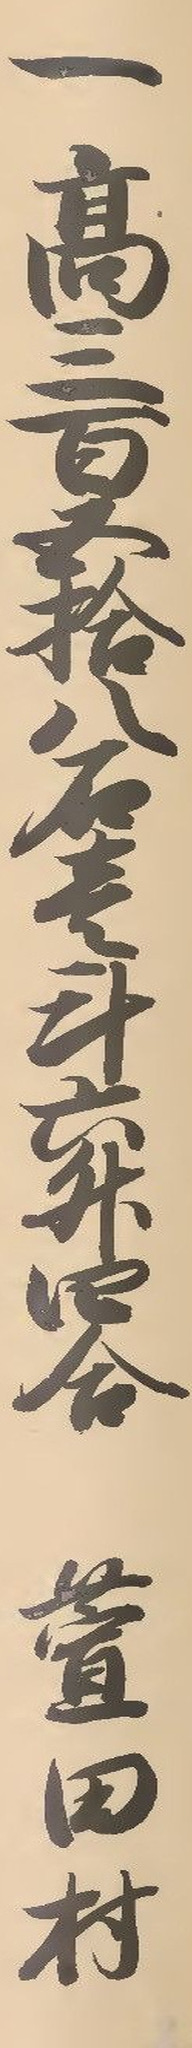一高三百五拾八石壱斗六升四合萱田村
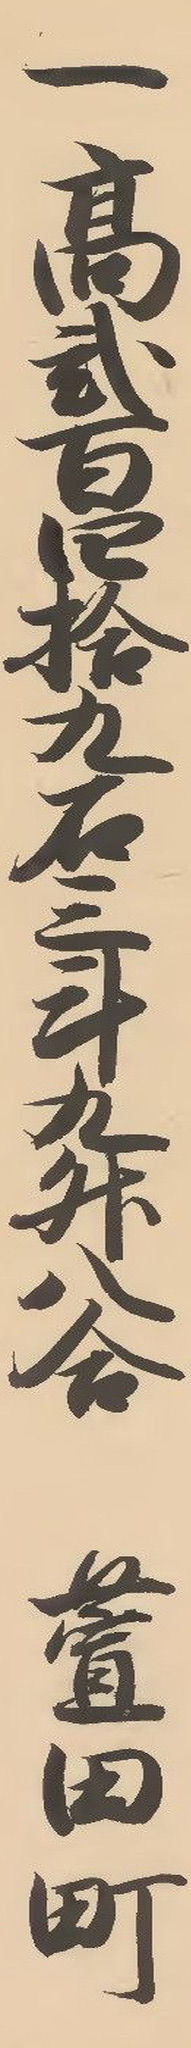一高弐百四拾九石三斗九升八合萱田町
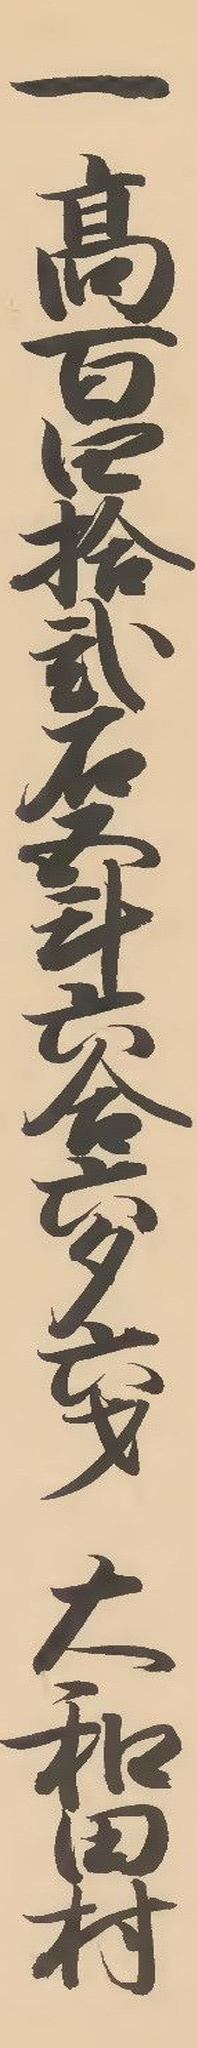一高百四拾弐石五斗六合六勺六才大和田村
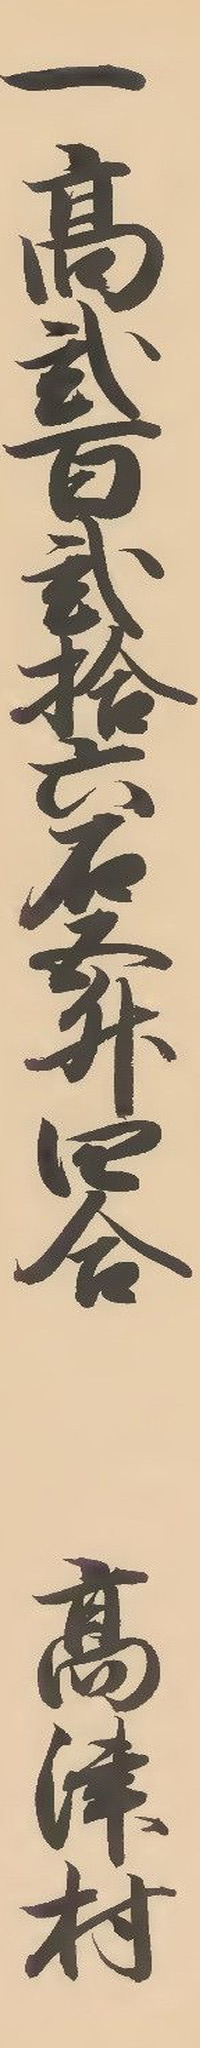一高弐百弐拾六石五升四合高津村

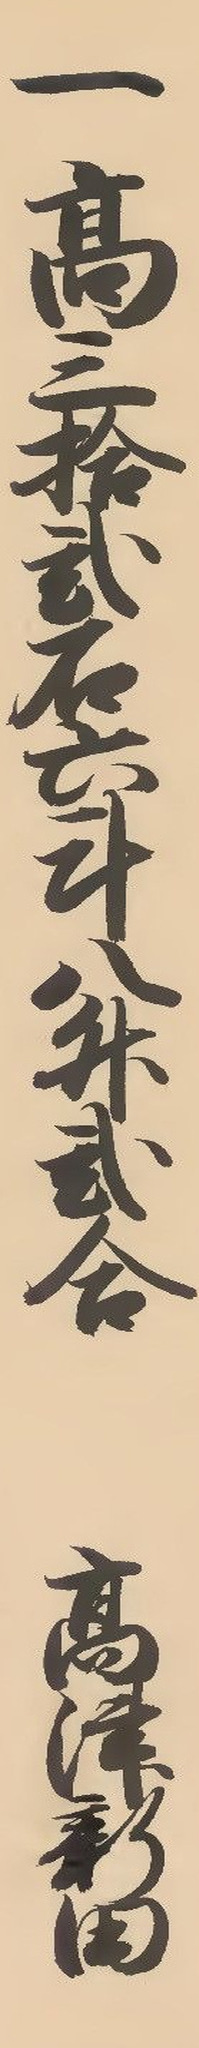一高三拾弐石六斗八升弐合高津新田
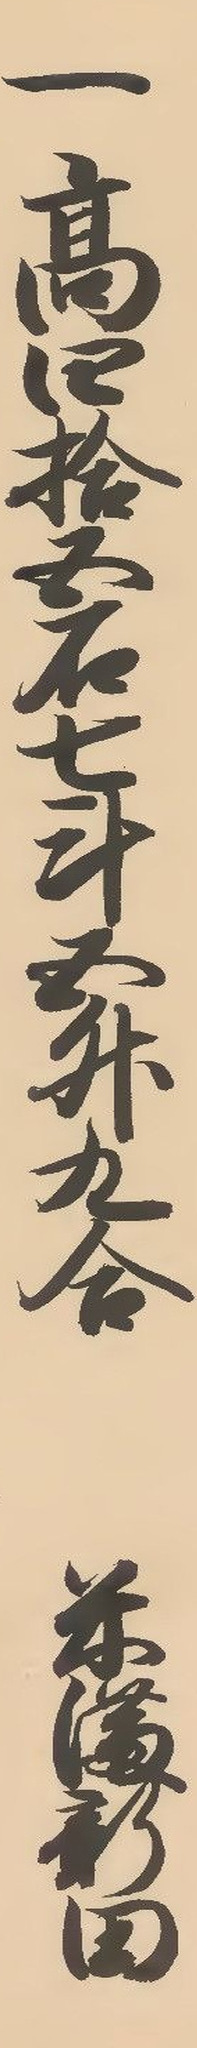一高四拾五石七斗五升九合米満新田
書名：下総国郷帳
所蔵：国立公文書館 National Archives of Japan
